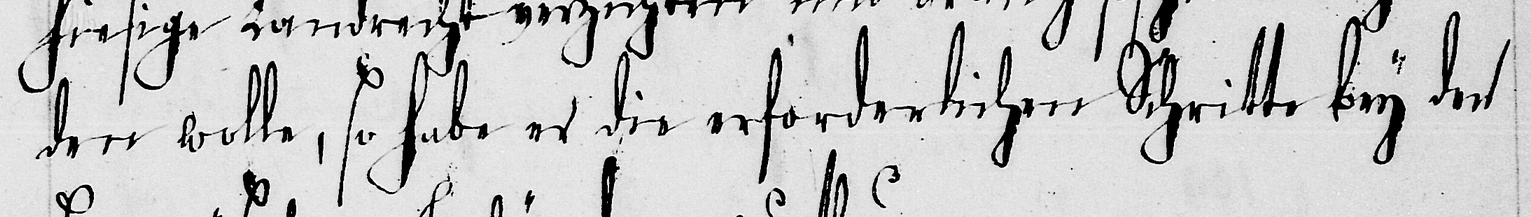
en wolle, so habe er die erforderlichen Schritte bey den
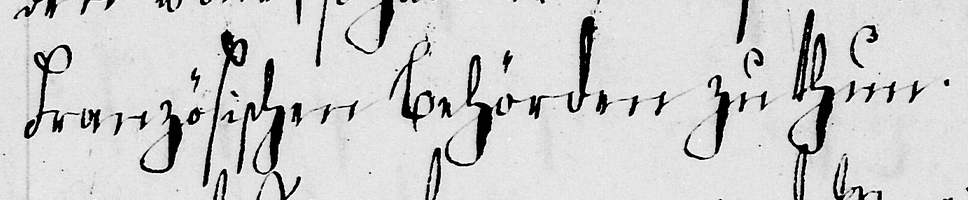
Französischen Behörden zu thun.
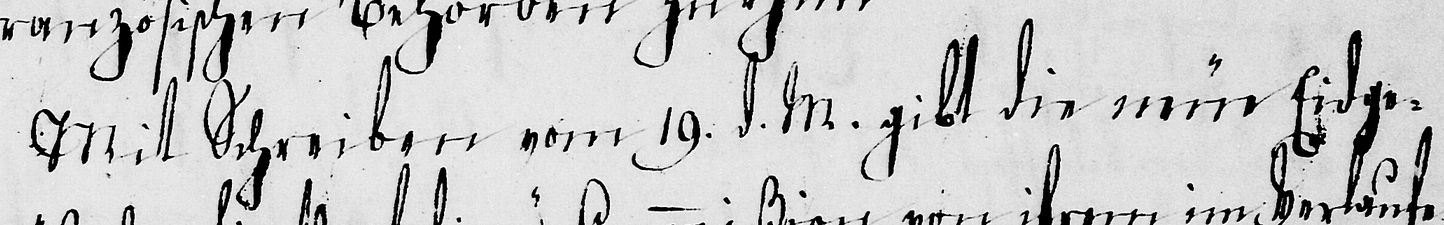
Mit Schreiben vom 19. d. M. gibt die neue Eidge¬
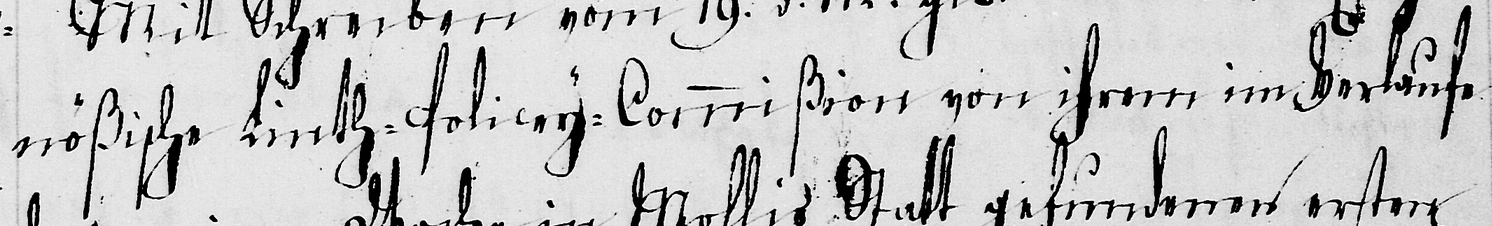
nößische Linth-Policey-Commißion von ihrem im Verlaufe
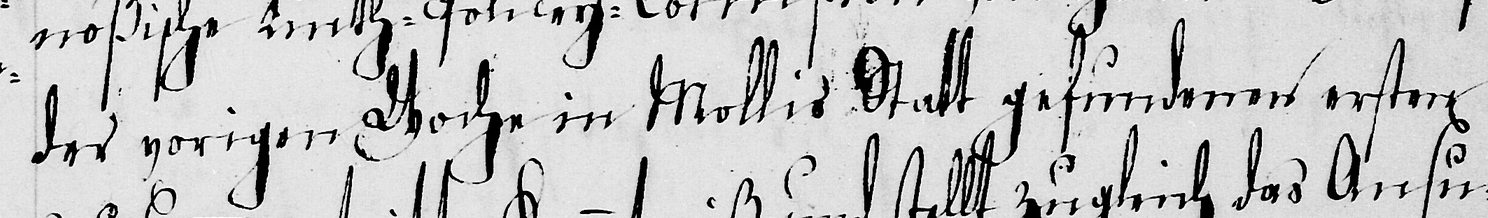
der vorigen Woche in Mollis Statt gefundenen ersten
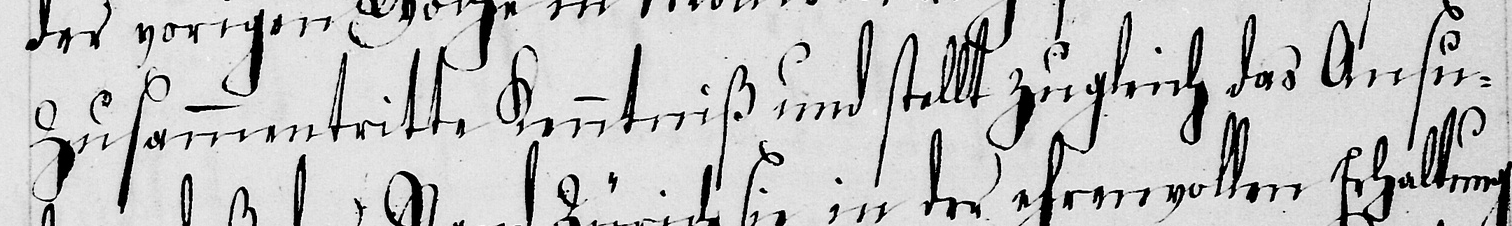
Zusammentritte Kenntniß und stellt zugleich das Ansu¬
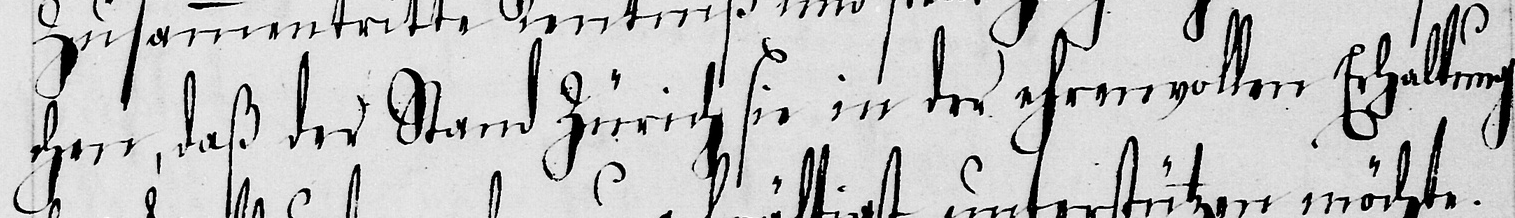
chen, daß der Stand Zürich sie in der ehrenvollen Erhaltung
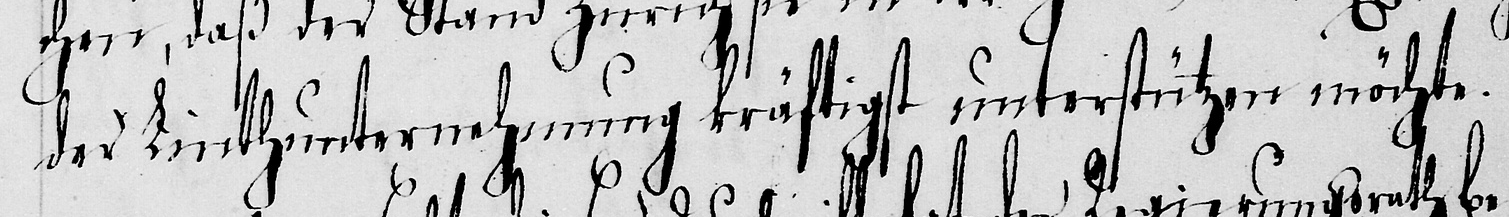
der Linthunternehmung kräftigst unterstützen möchte.
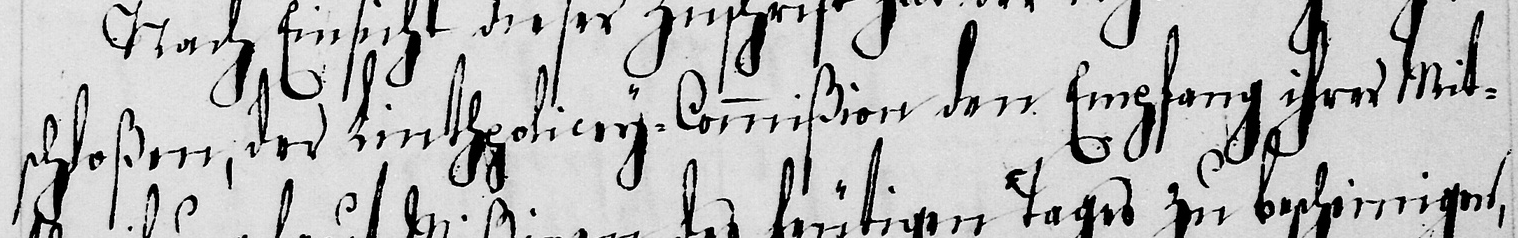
schloßen, der Linthpolicey-Commißion den Empfang ihrer Mit¬
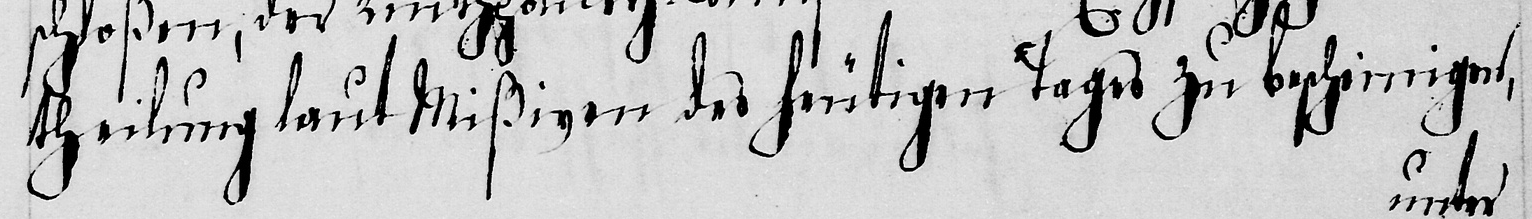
theilung laut Mißiven des heutigen Tages zu bescheinigen,
